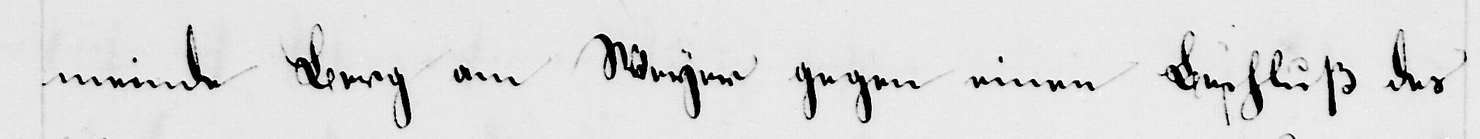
meinde Berg am Weyer gegen einen Beschluß des
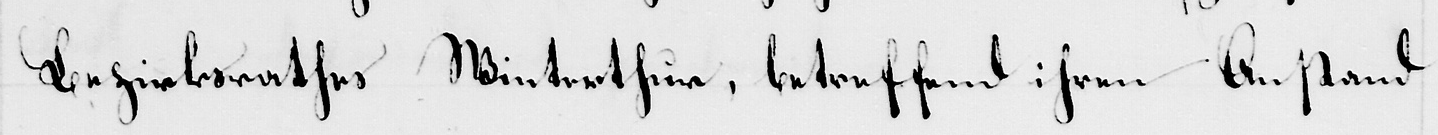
Bezirksrathes Winterthur, betreffend ihren Anstand
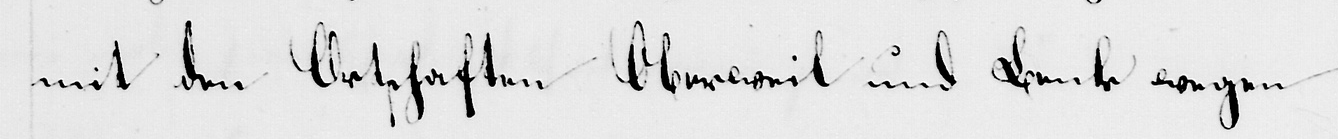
mit den Ortschaften Oberweil und Benk wegen
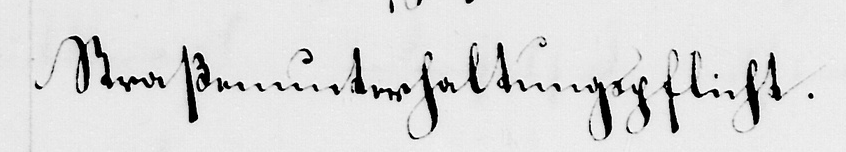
Straßenunterhaltungsspflicht.
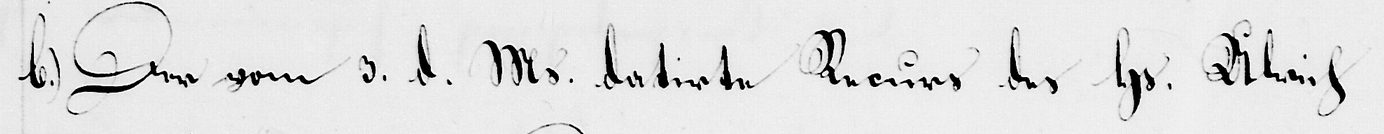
b.) Der vom 3. d. Ms. datirte Recurs des Hs. Ulrich
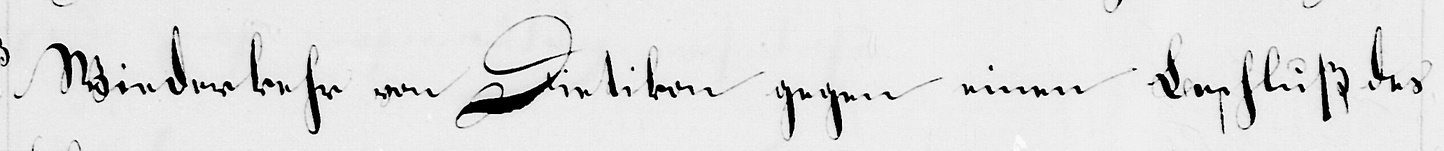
Wiederkehr von Dietikon gegen einen Beschluß des
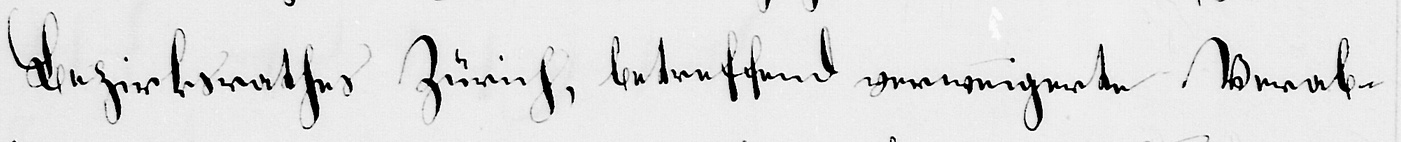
Bezirksrathes Zürich, betreffend verweigerte Verab¬
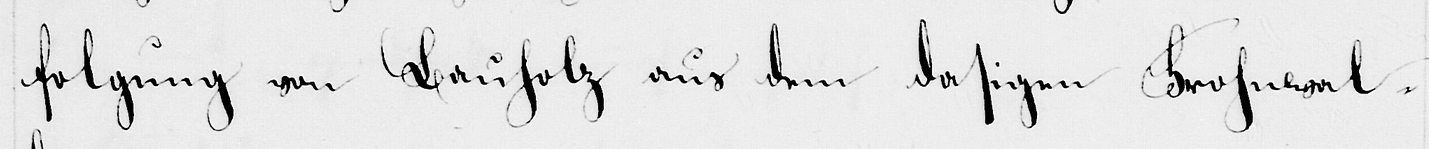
folgung von Bauholz aus dem dasigen Frohnwal¬
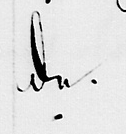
de.
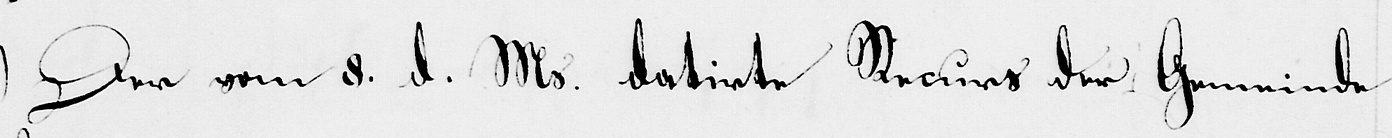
Der vom 8. d. Ms. datirte Recurs der Gemeinde
